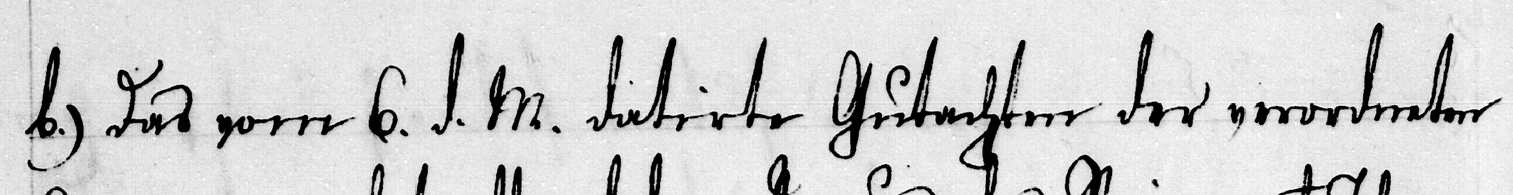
b.) Das vom 6. d. M. datirte Gutachten der verordneten
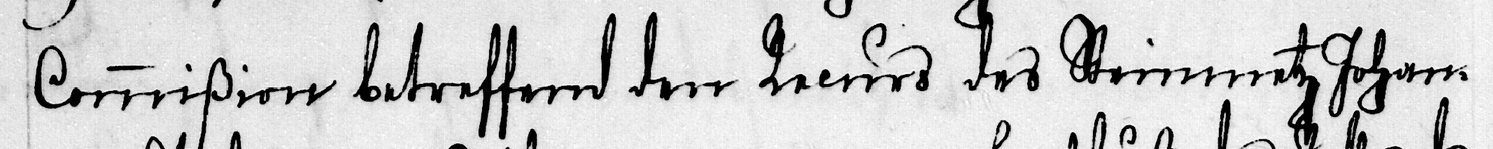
Commißion betreffend den Recurs des Steinmetz Johan¬
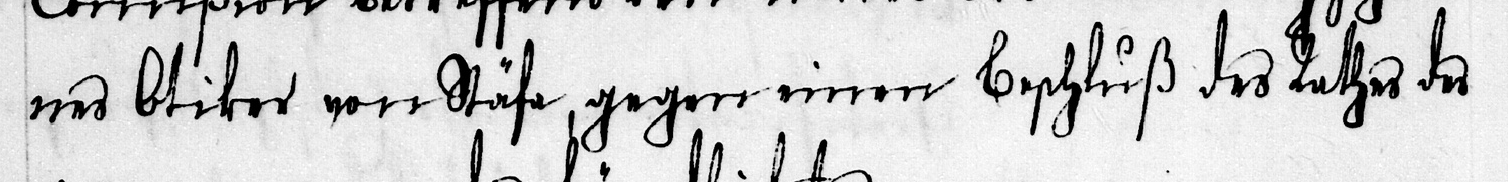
nes Otiker von Stäfa, gegen einen Beschluß des Rathes des
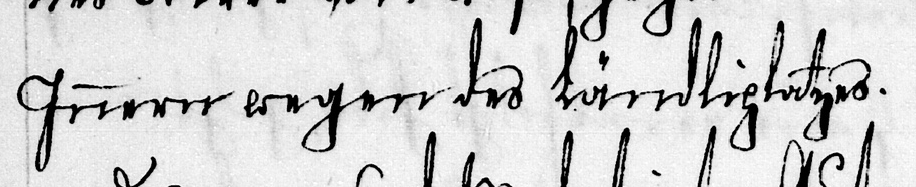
Innern wegen des Ländliplatzes.
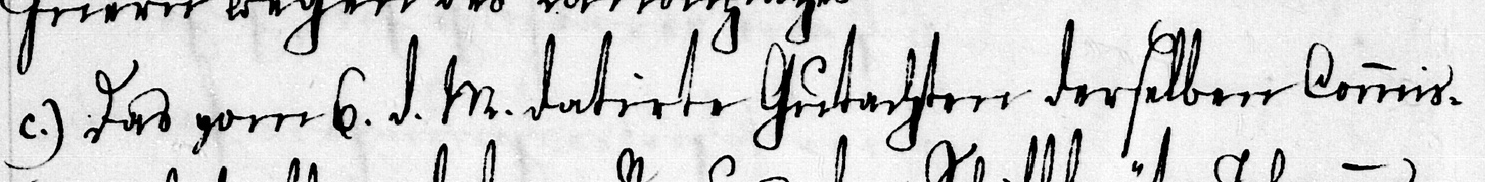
c.) Das vom 6. d. M. datirte Gutachten derselben Commiß¬
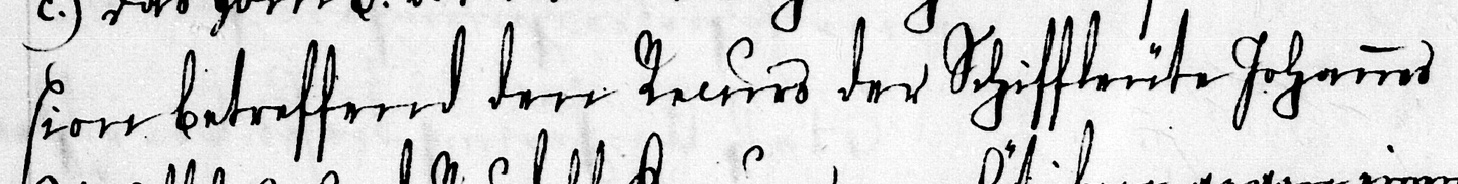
ion betreffend den Recurs der Schiffleute Johannes
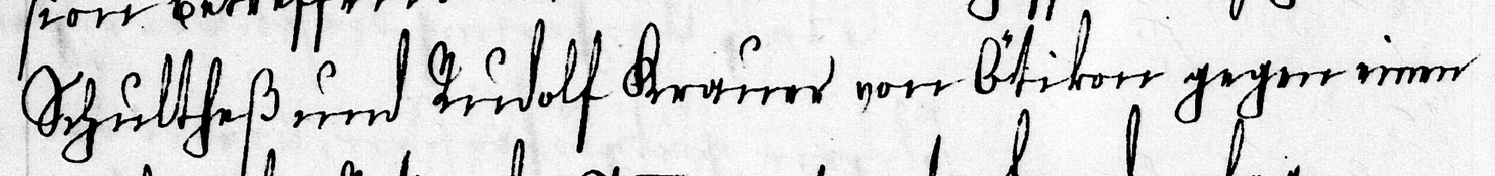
Schultheß und Rudolf Krauer von Ötikon gegen einen
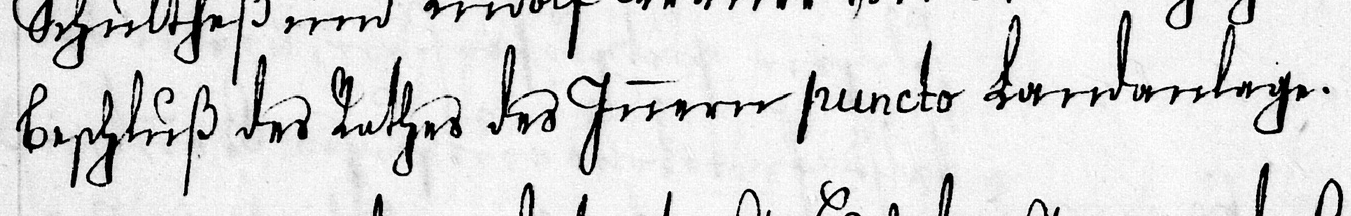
Beschluß des Rathes des Innern puncto Landanlage.
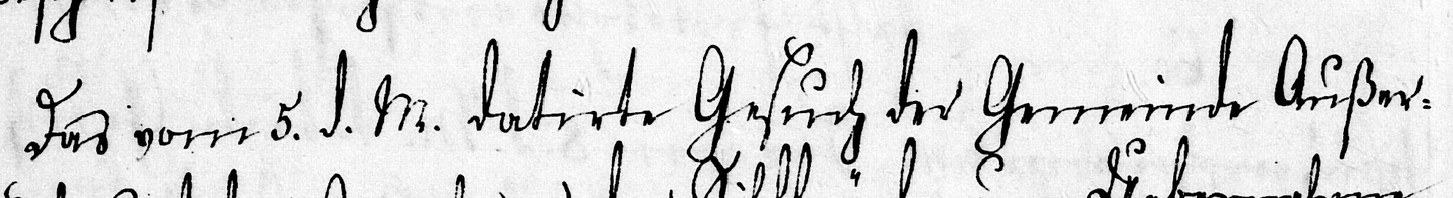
Das vom 5. d. M. datirte Gesuch der Gemeinde Außer¬
